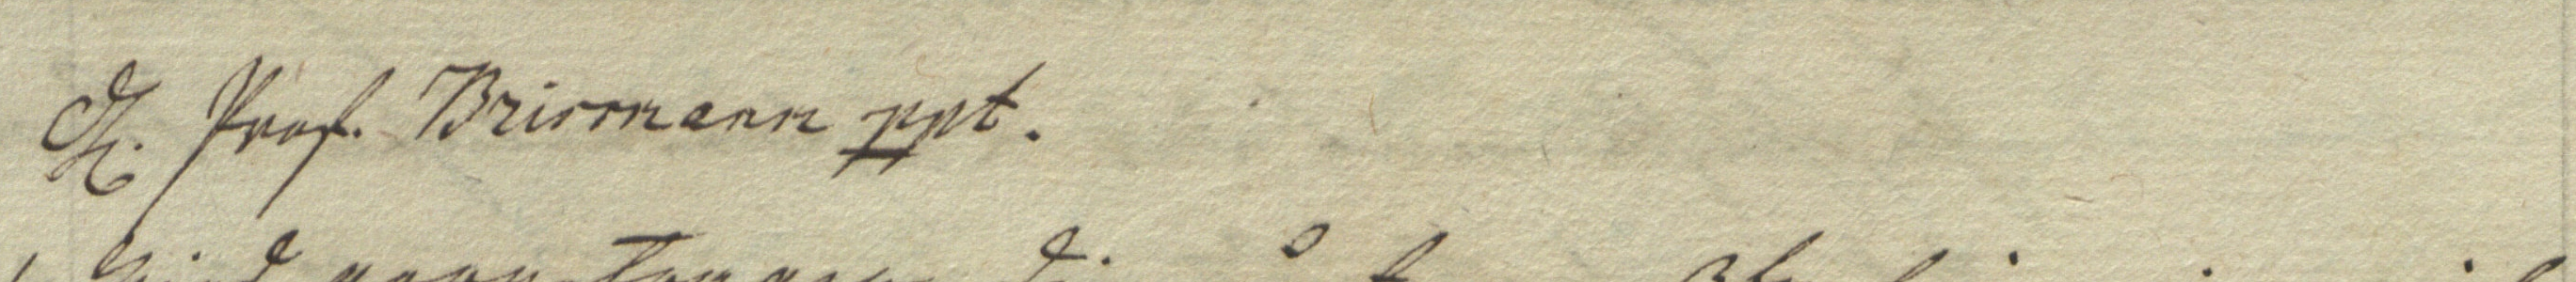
dh. Prof. Brismann ppt.
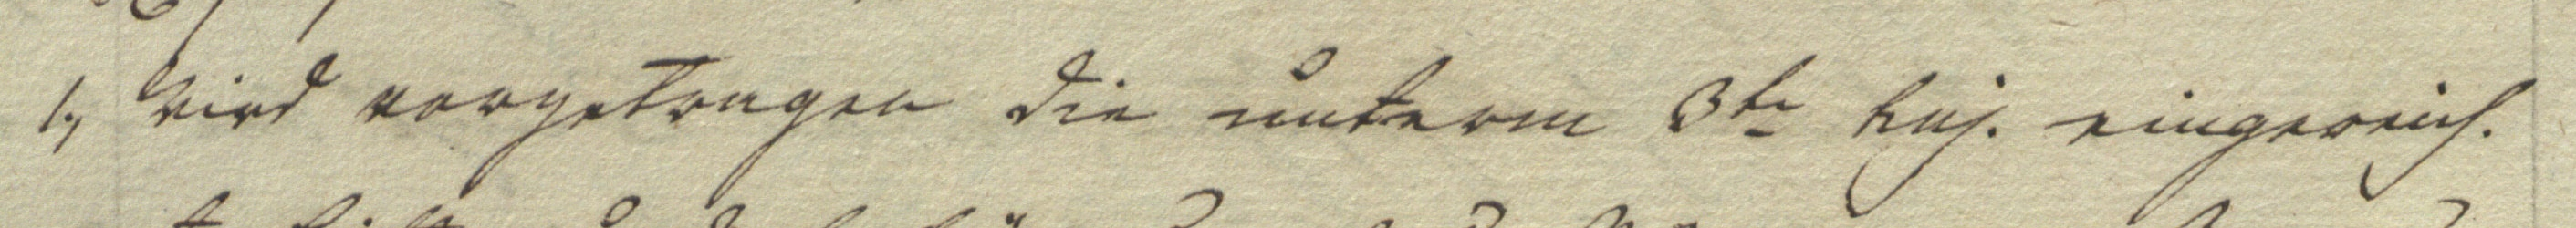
1., Wird vorgetragen die unterm 3ten huj. eingereich¬
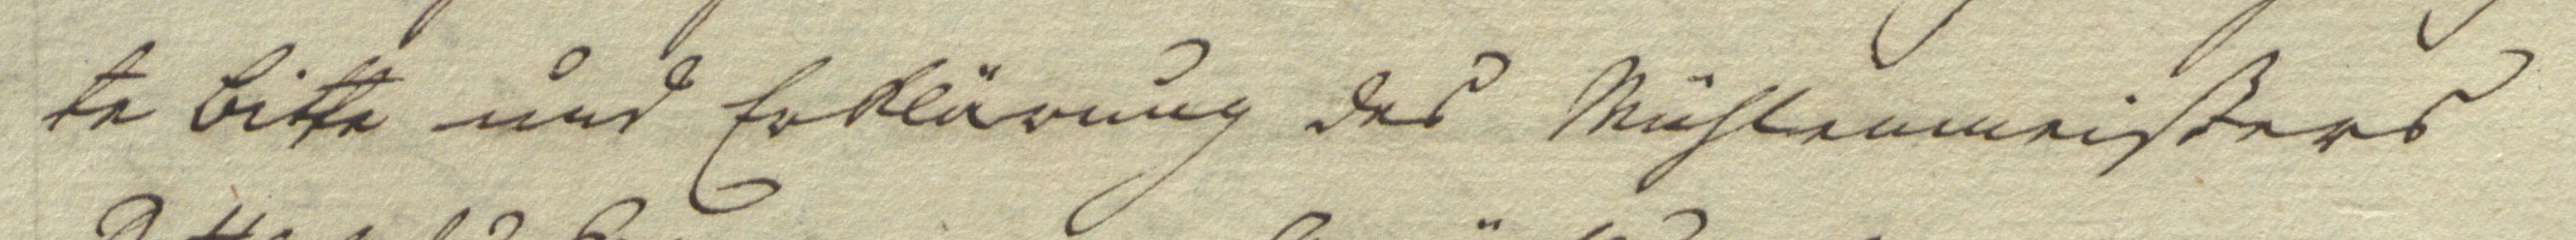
te Bitte und Erklärung des Mühlenmeisters
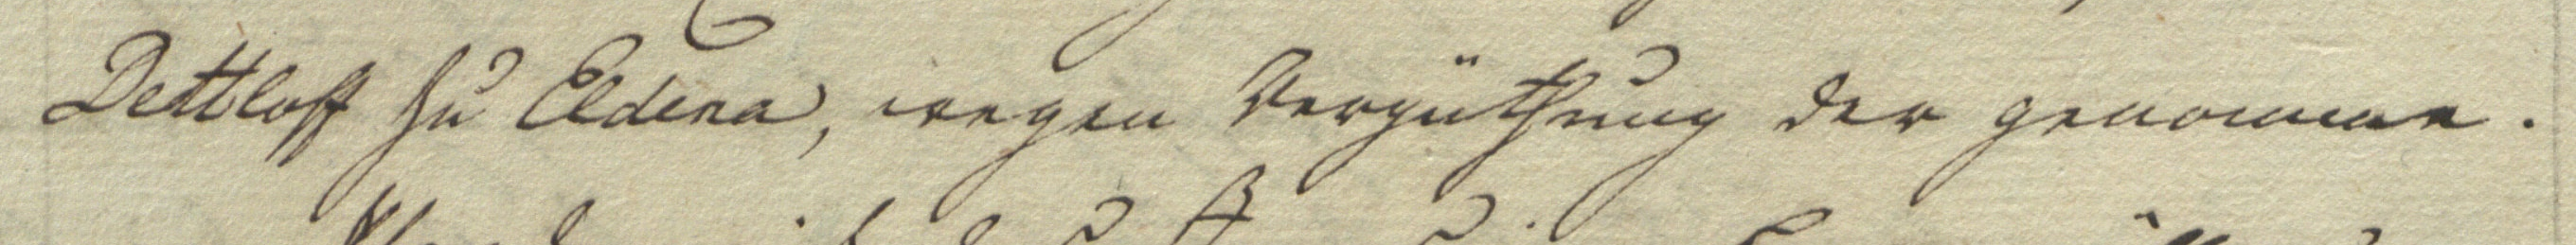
Dettloff zu Eldena, wegen Vergüthung der genomme¬
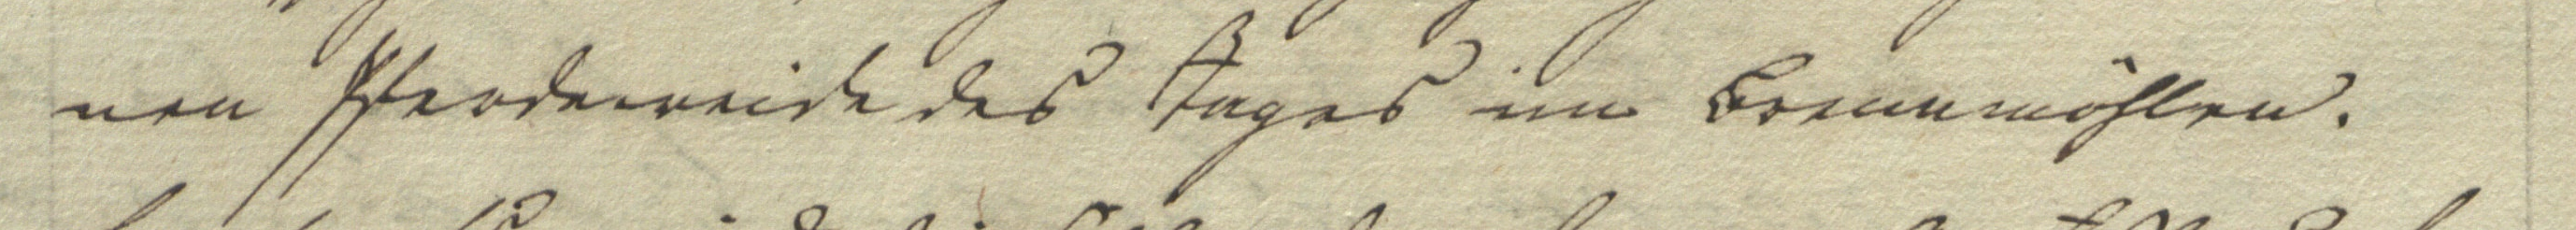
nen Pferdeweide des Tages im Brennmöhlen
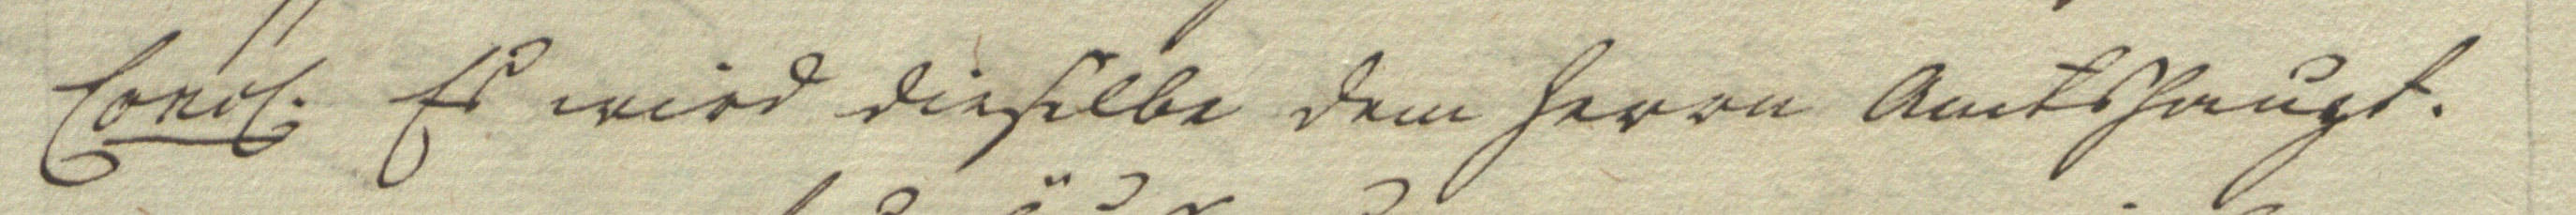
Concl. Es wird dieselbe dem Herrn Amtshaupt¬
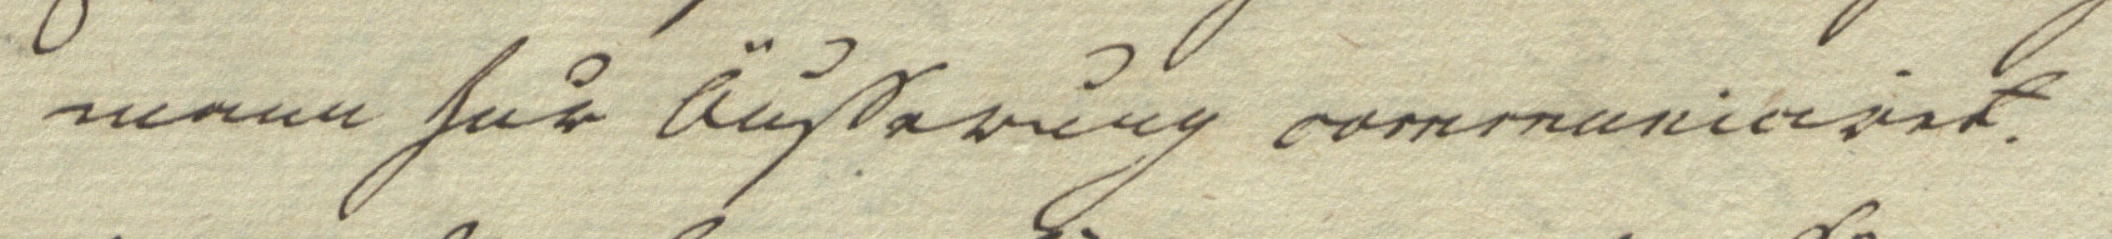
mann zur Äusserung communiciret.
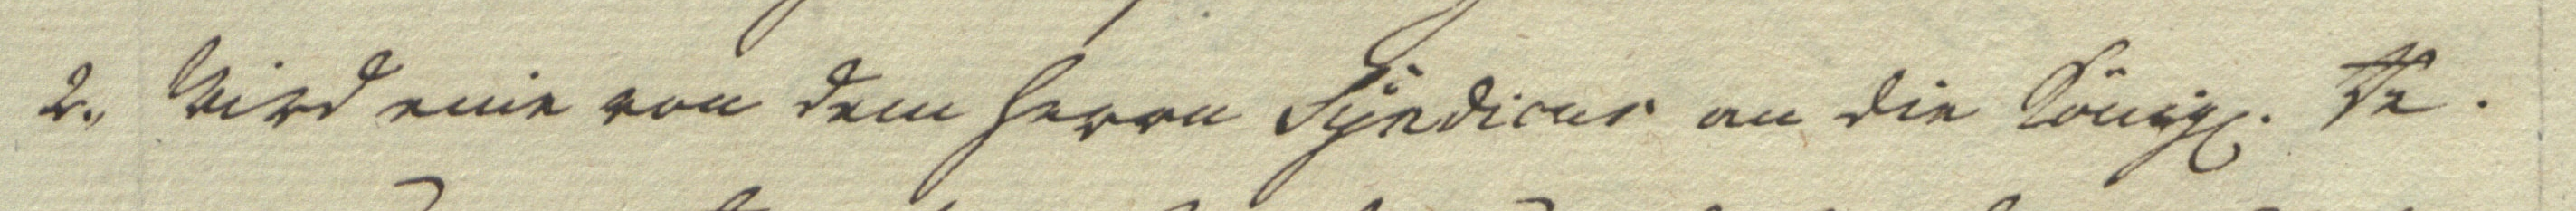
2., Wird eine von dem Herrn Syndicus an die Königl. Re¬
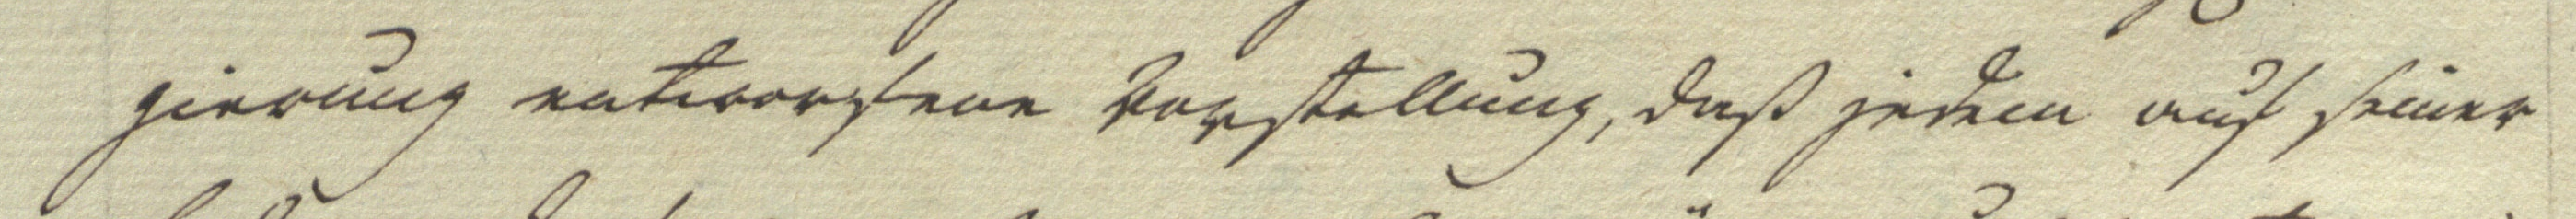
gierung entworfene Vorstellung, daß jedem auf seiner
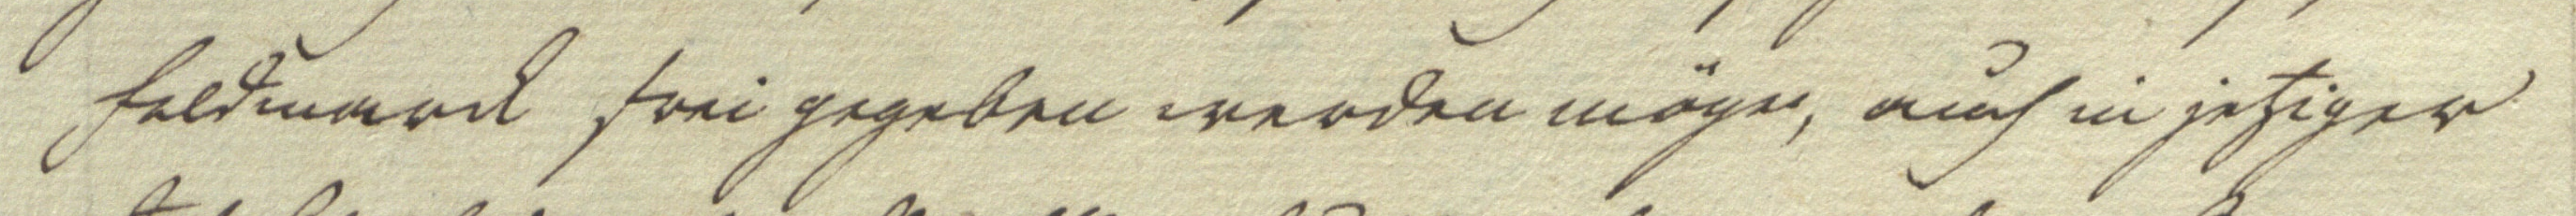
Feldmark frei gegeben werden möge, auch in jetziger
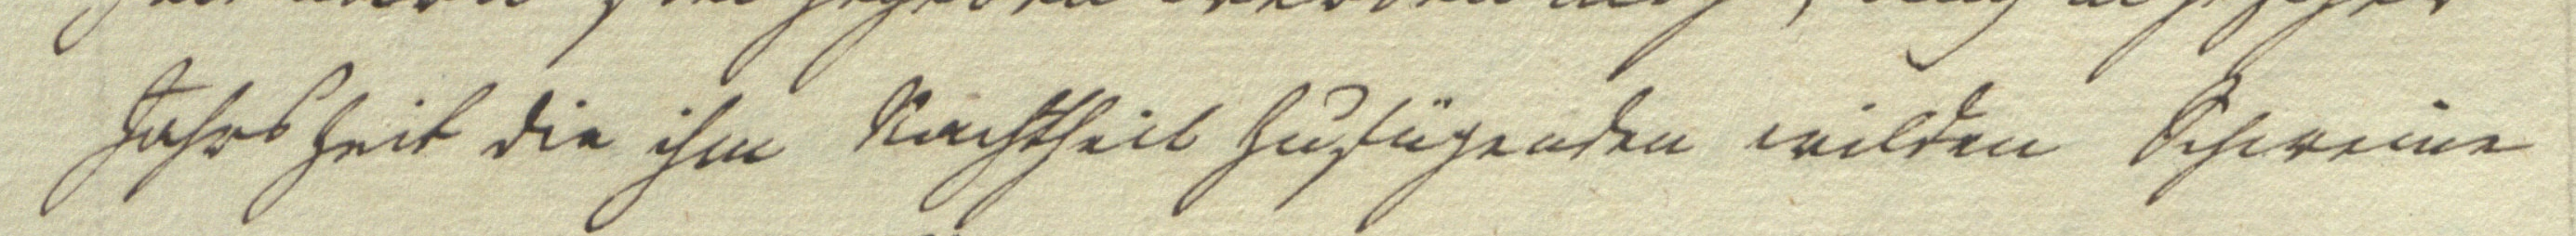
Jahreszeit die ihm Nachtheil zufügenden wilden Schweine
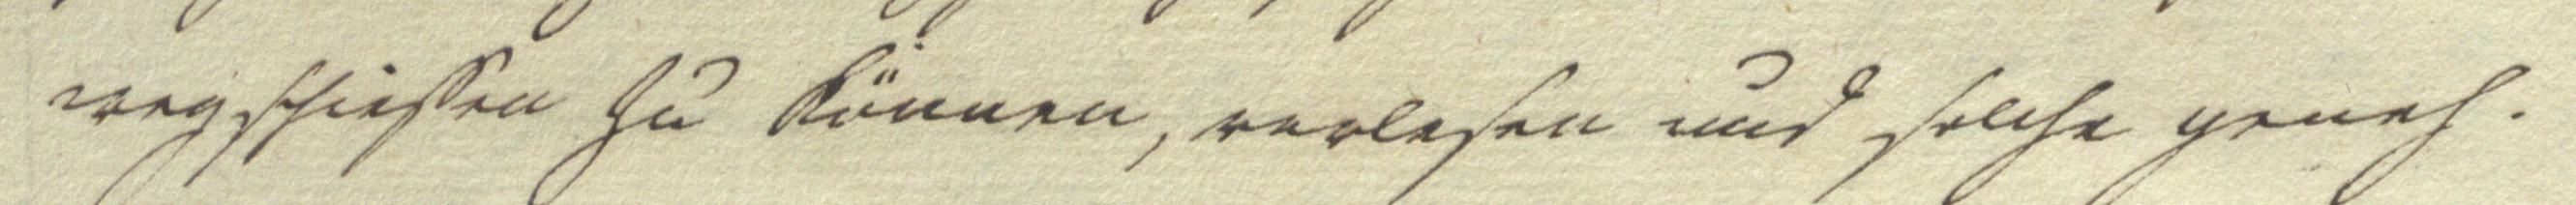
wegschiessen zu können, verlesen und solche geneh¬
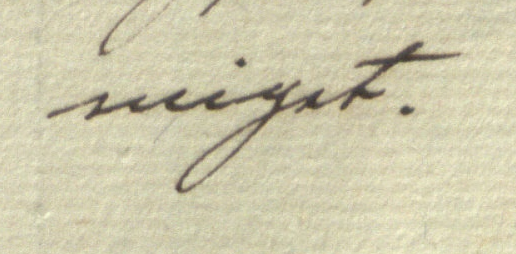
miget.
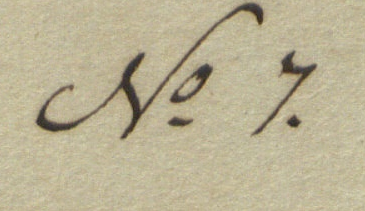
No. 7.
